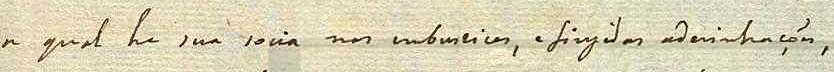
a qual he sua socia nas embusticas, e fingidas adevinhaçoẽs,
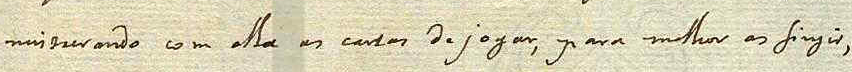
misturando com ella as couzas de jogar, para melhor as fingir,
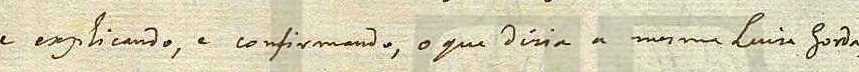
e explicando, e confirmando, o que dizia a mesma Luiza Gorda,
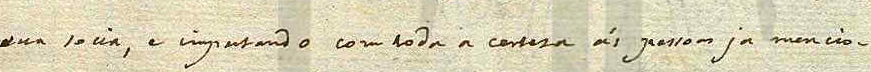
sua socia, e imputando com toda a certeza ás pessoas ja mencio
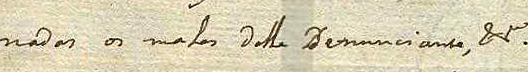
nadas os males delle Denunciante, &ra.
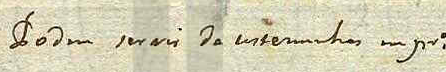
Podem servir de testemunhas em pr.o
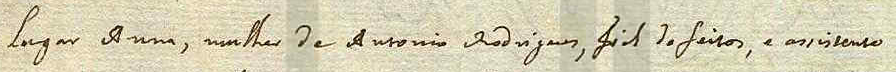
Lugar Anna, mulher de Antonio Rodrigues, fiel do feitor, e assistente
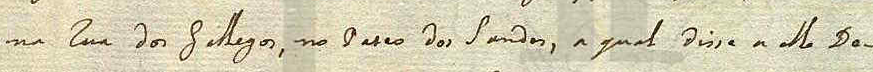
na Rua dos Gallegos, no Pateo dos Sandes, a qual disse a elle De
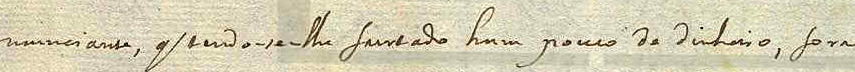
nunciante, q̄ tendo-se-lhe furtado hum poco de dinheiro, fora
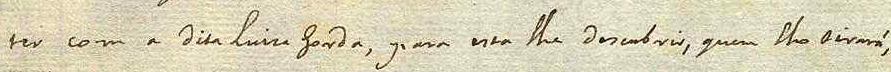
ter com a dita Luiza Gorda, para esta lhe descubrir, quem lho tirará,
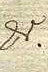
&ra
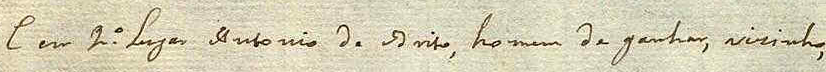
E em 2.o Lugar Antonio de Brito, homem de ganhar, vizinho,
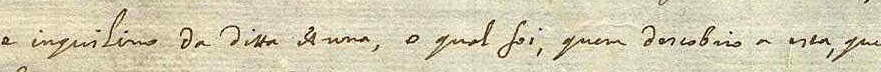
e inquiLino da ditta Anna, o qual foi, quem descobrio a essa, que
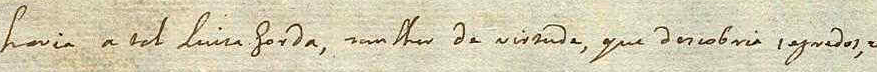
havia a tal Luiza Gorda, mulher de virtude, que descobria segredos, e
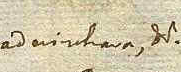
adevinhava, &ra.
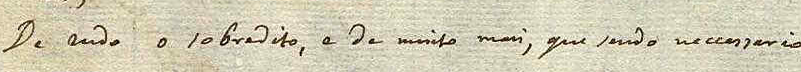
De tudo o sobredito, e de muito mais, que sendo neccessario,
